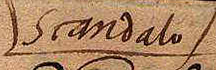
scandalo /
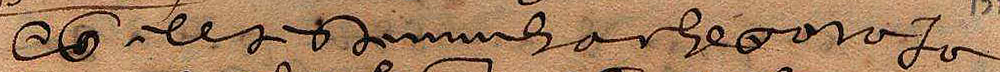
e q̄ ele testemunha chegara Ja
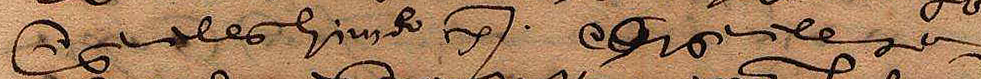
ē se eles himdo c̄ꝭ /. e dise ele ta
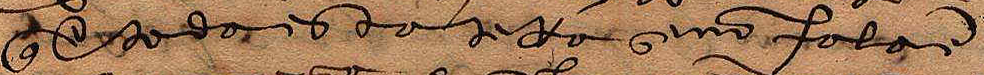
q̄ ē toda esta teRa se nō fala ē
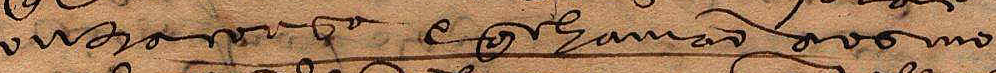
outra cousa e q̄ chamão aos mo
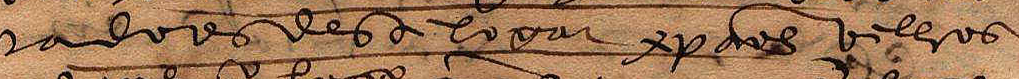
radores deste logar xpaõs velhos
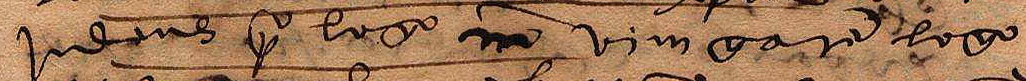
Judeus p̄o logo nō vimgarē logo
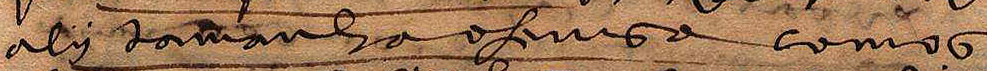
aly tamanha ofemsa como se
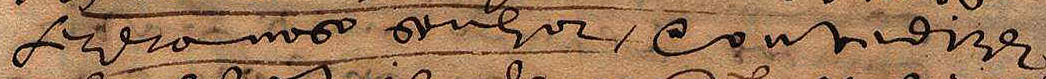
fezera noso senhor / e ouve dizer
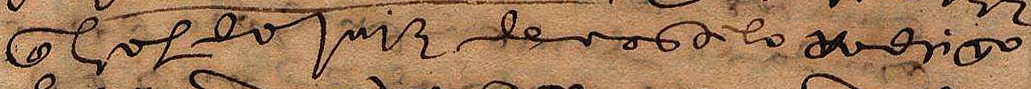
q̄ ho Ldo Juiz de castelo Rodrigo
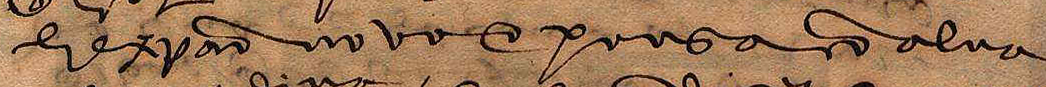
he xpaõ novo e pousa c̄o alua
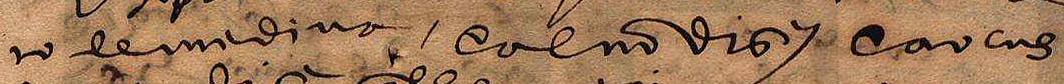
ro de medina / e al nō dise / e ao cus
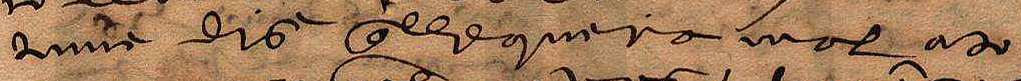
tume dise q̄ lhe queria maL a to
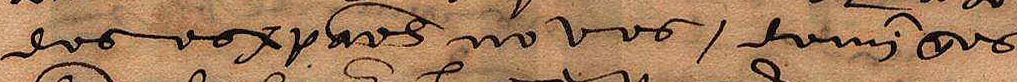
dos os xpaõs novos / domj̄gos
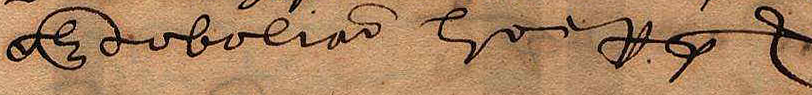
glz̄ tabaliaõ ho estp̄i
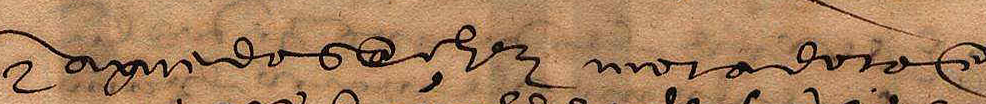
item agueda sāchez moradora ē
